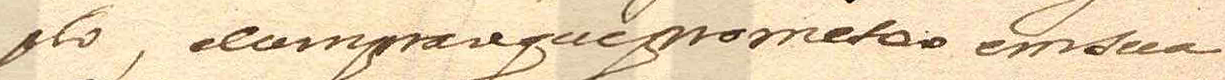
plo, e cumpra o que prometeo em sua
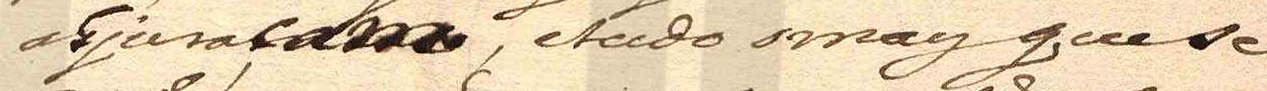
abjuraçam, e tudo o mais que se
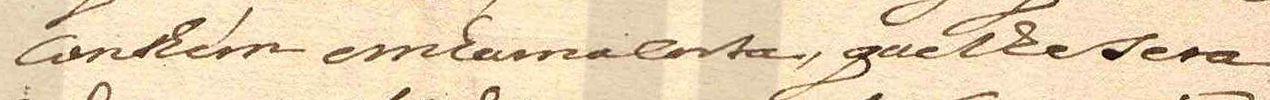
conthem em huma carta, que lhe sera
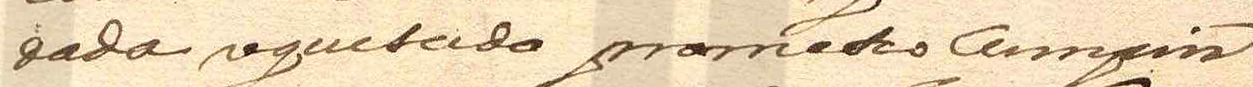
dada o que tudo prometeo cumprir
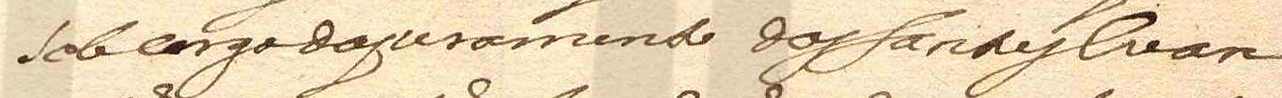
sob cargo do juramento dos santos Evan
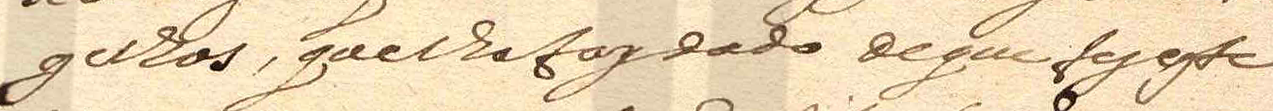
gelhos, que lhe foy dado de que fes este
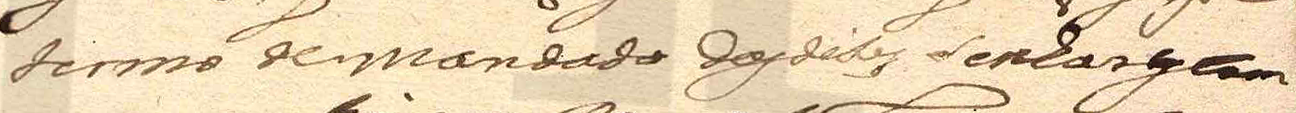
termo de mandado dos ditos senhores com
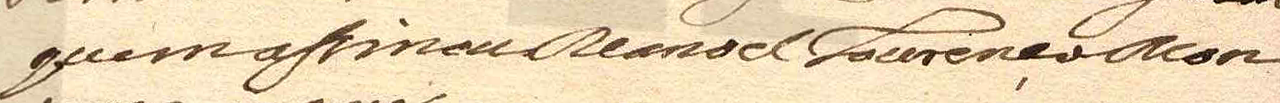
quem assinou Manoel Lourenço Mon
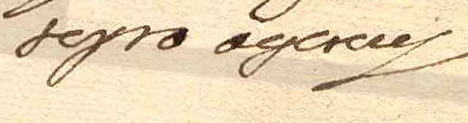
teyro o escreuj
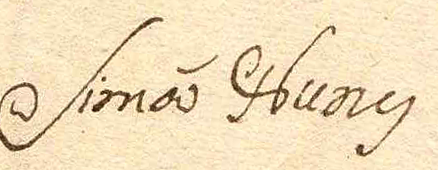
Simaõ Nunes
